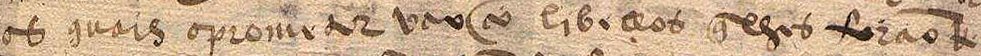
os quais o prometor veo c̄o libellos q̄ lhes forão Re
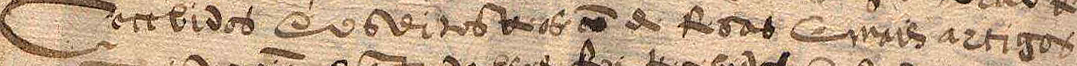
Cecebidos e os ditos Reos c̄o defesas e mais artigos
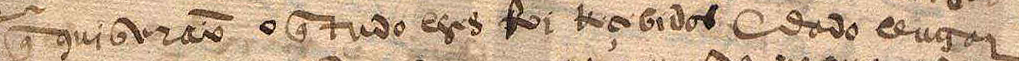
q̄ quiserão o q̄ tudo lhes foi Reçebidos e dado llugar
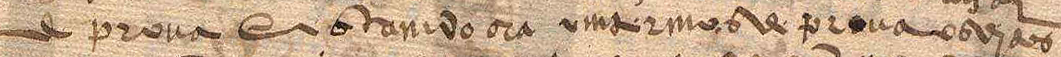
de proua e estamdo ora em termos de proua os djtos
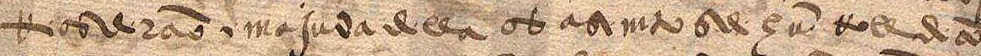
Reos derão em aJuda della os asemtos de hū Roll de c̄o
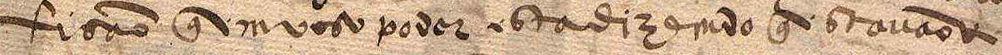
fisão q̄ em voso poder esta dizemdo q̄ estauão Re
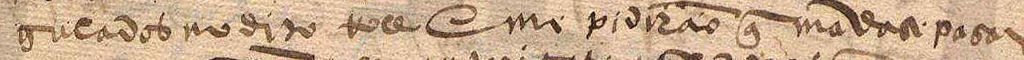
gulados no dito Roll e me pidirão q̄ mādase pasar
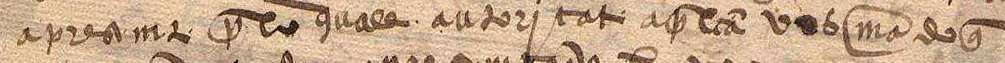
a presemte p̄lo quall autorjtate ap̄lcā vos mādo q̄
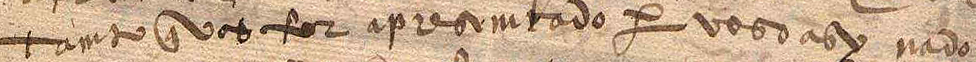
tamto q̄ vos for apresemtado ꝑ voso asynado
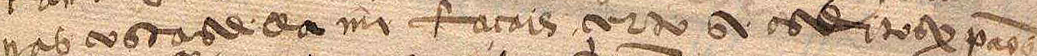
nas costas della me façais çerto se os ditos Xpãos
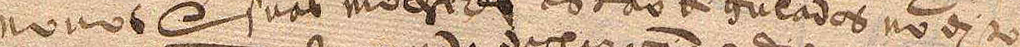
nouos e suas molheres estão Regulados no djto
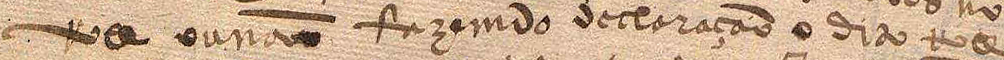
Roll ou não fazemdo declaração o dito Roll
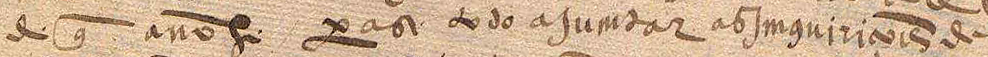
de q̄ a nō he / ꝑa se todo aJumtar as Jmquiriçõis de
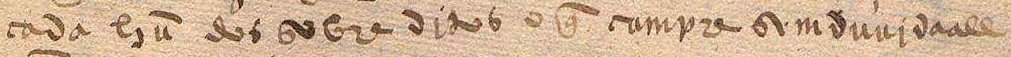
cada hū dos sobreditos o q̄ cumpre sem duujda all
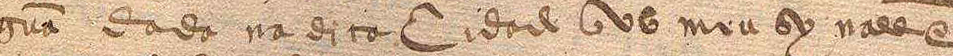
gūa dada na dita Cidade sob meu synall e
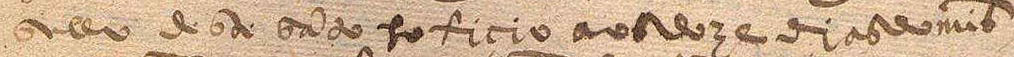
sello deste sāto hofiçio aos doze dias do mes
